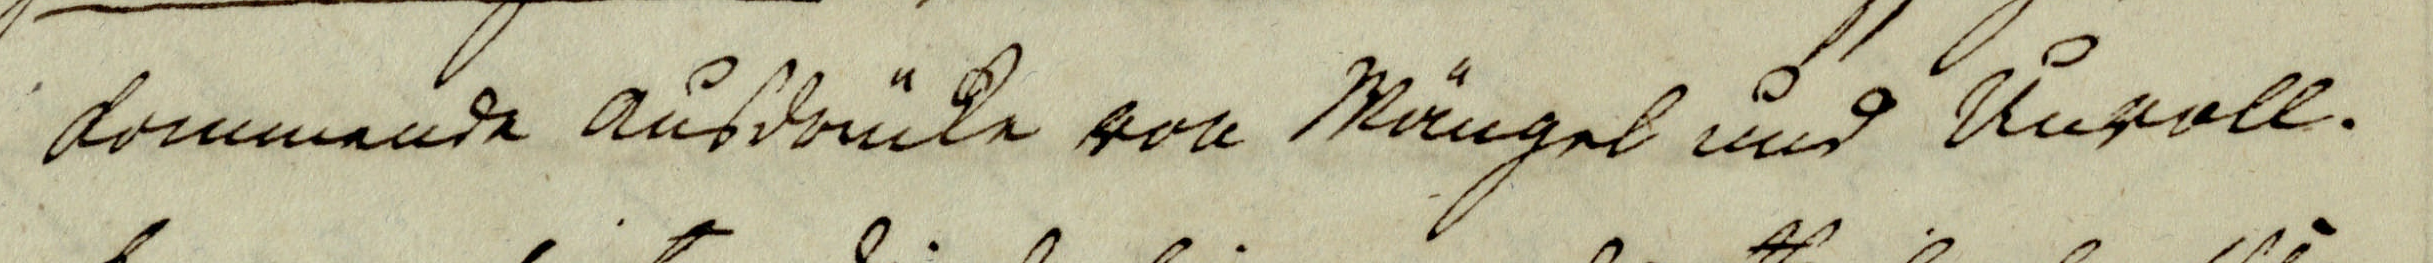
kommende Ausdrücke von Mängel und Unvoll¬
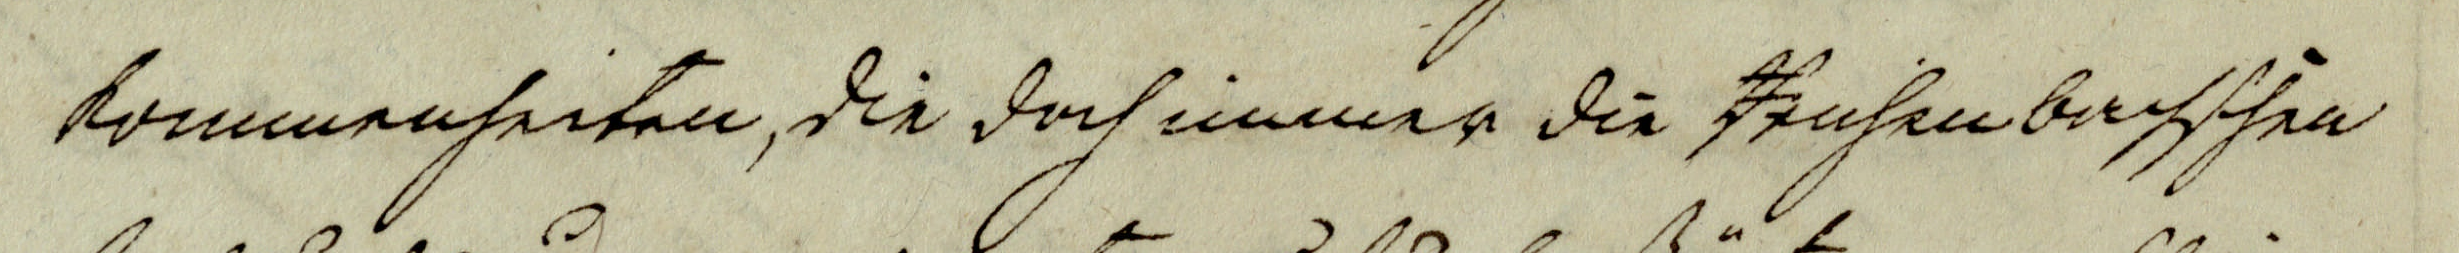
kommenheiten, die doch immer die Reichenbachschen
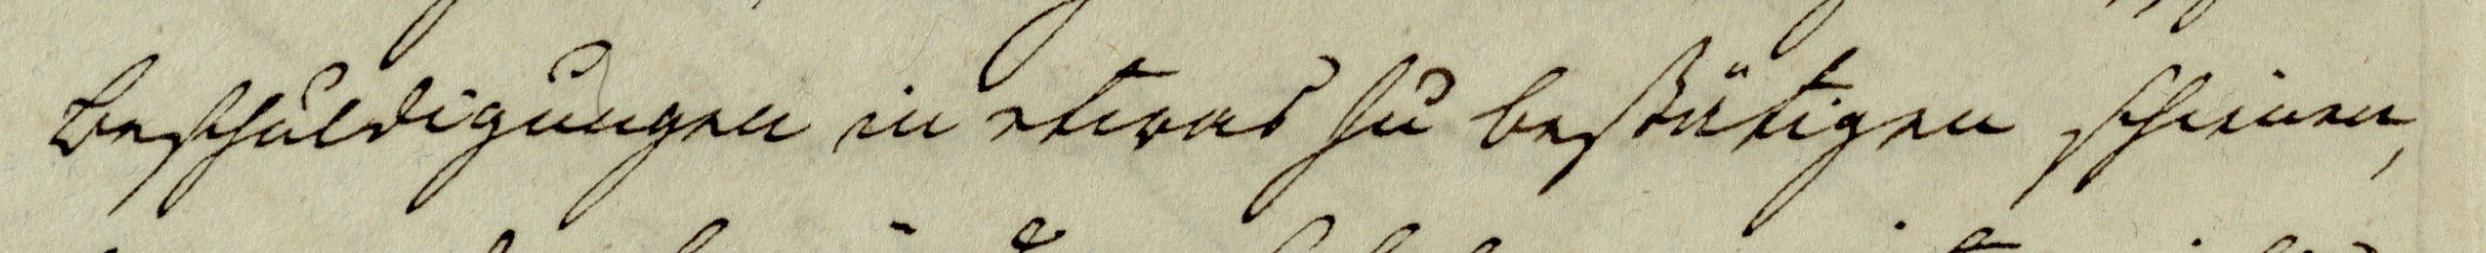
Beschuldigungen in etwas zu bestätigen schienen,
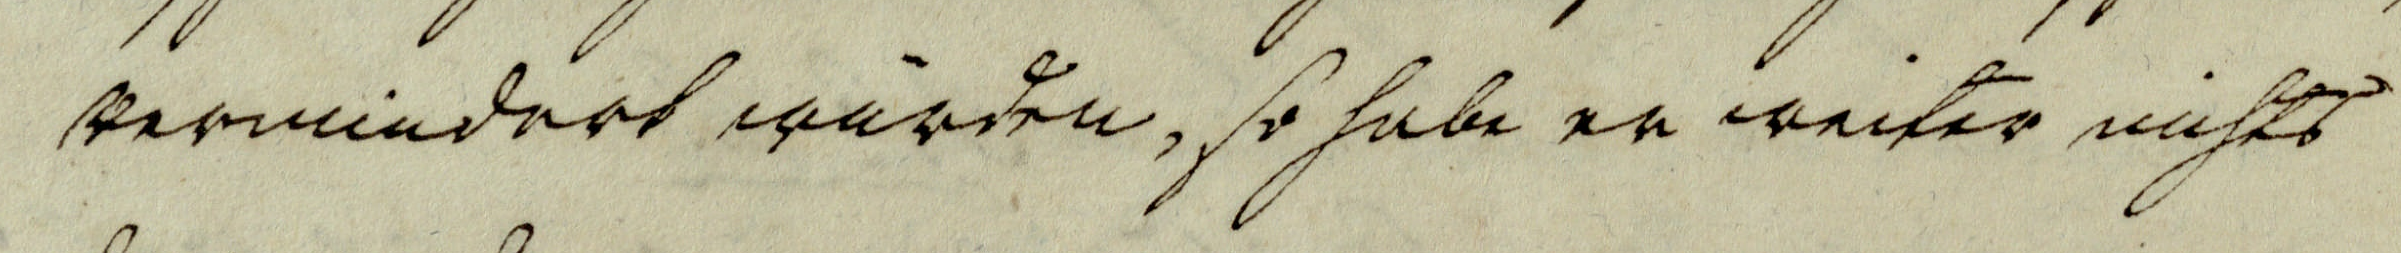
vermindert würden, so habe er weiter nichts
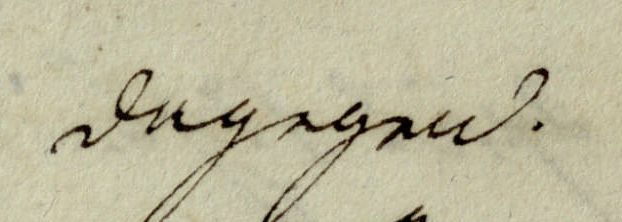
dagegen.
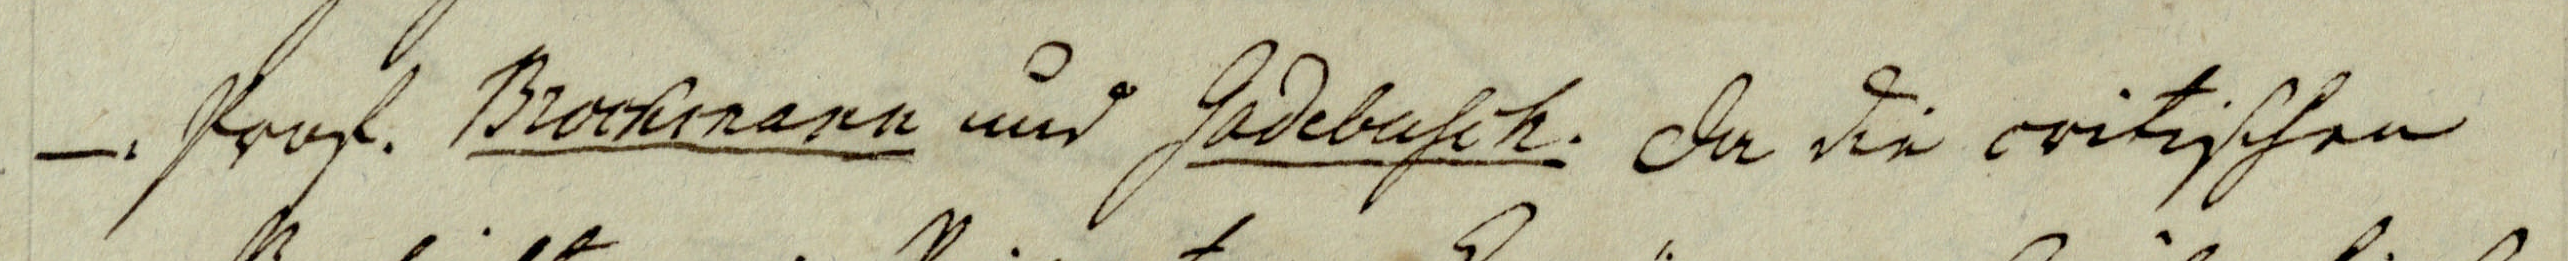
Prof. Brockmann und Gadebusch. Da die critischen
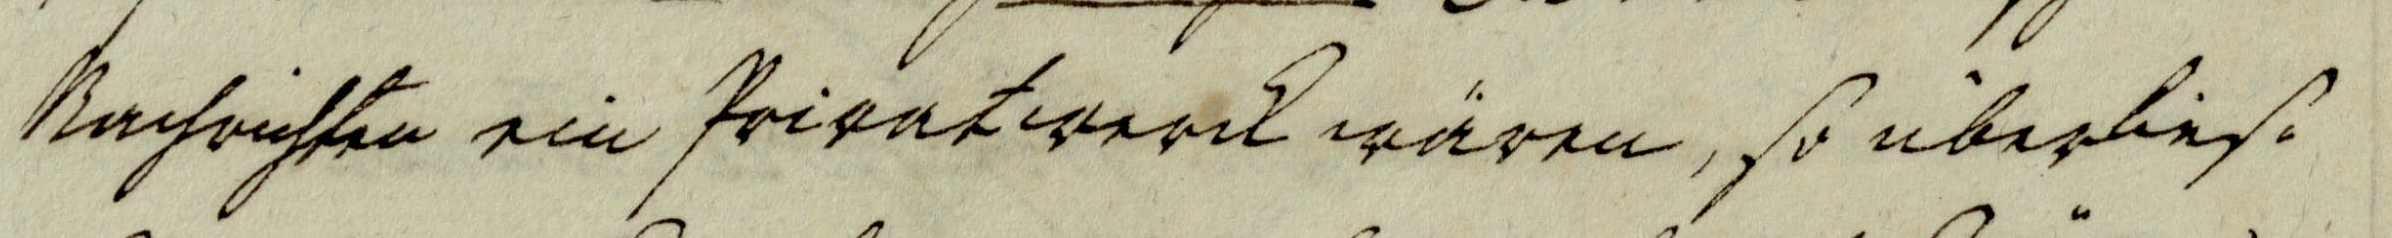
Nachrichten ein Privatwerck wären, so überlies¬
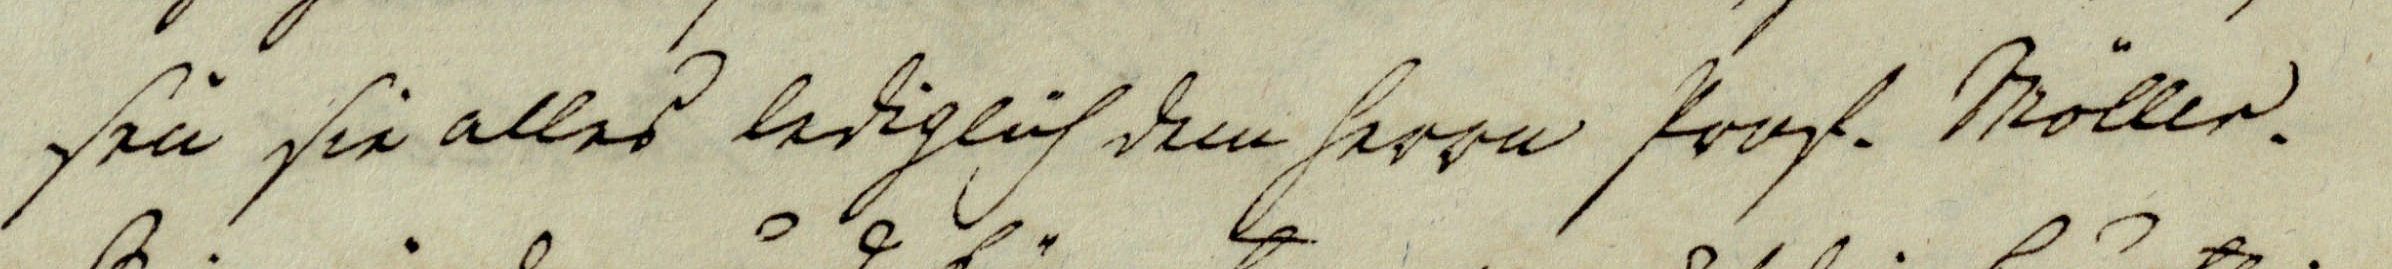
sen sie alles lediglich dem Herrn Prof. Möller.
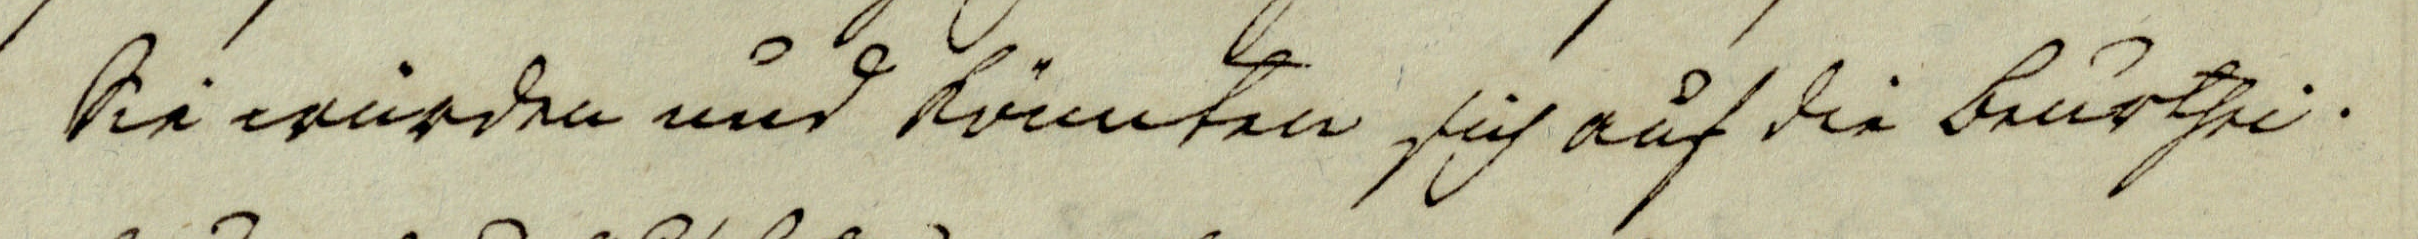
Sie würden und könnten sich auf die Beurthei¬
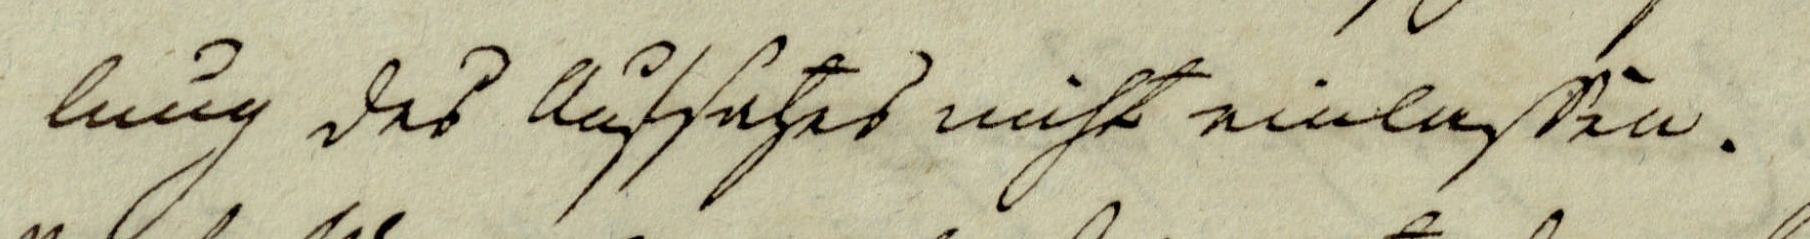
lung des Aufsatzes nicht einlassen.
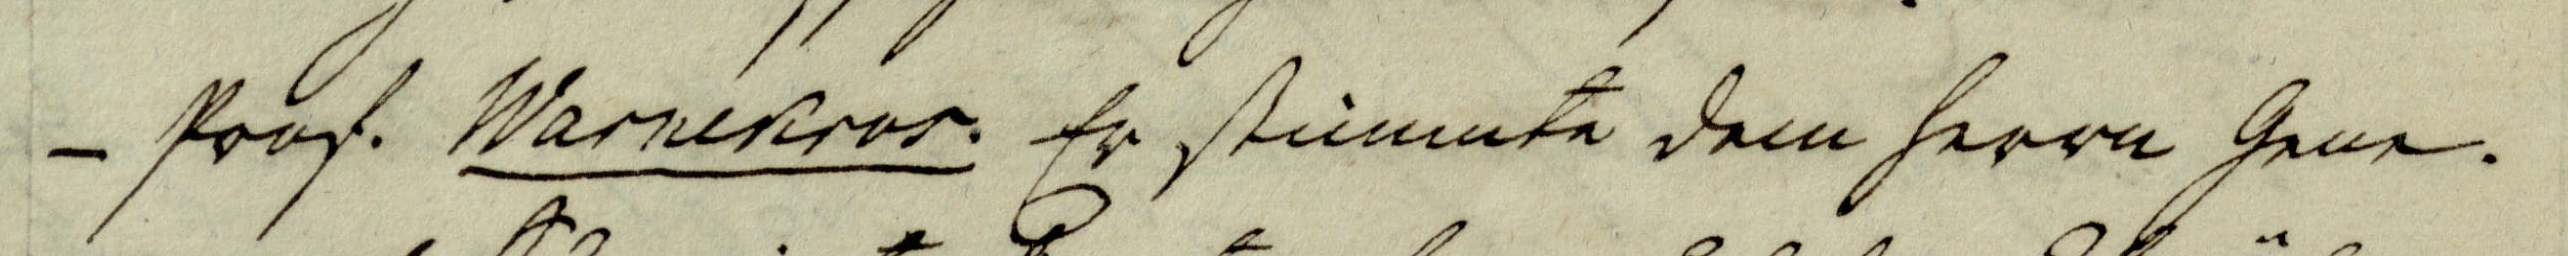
Prof. Warnekros. Er stimmte dem Herrn Gene¬
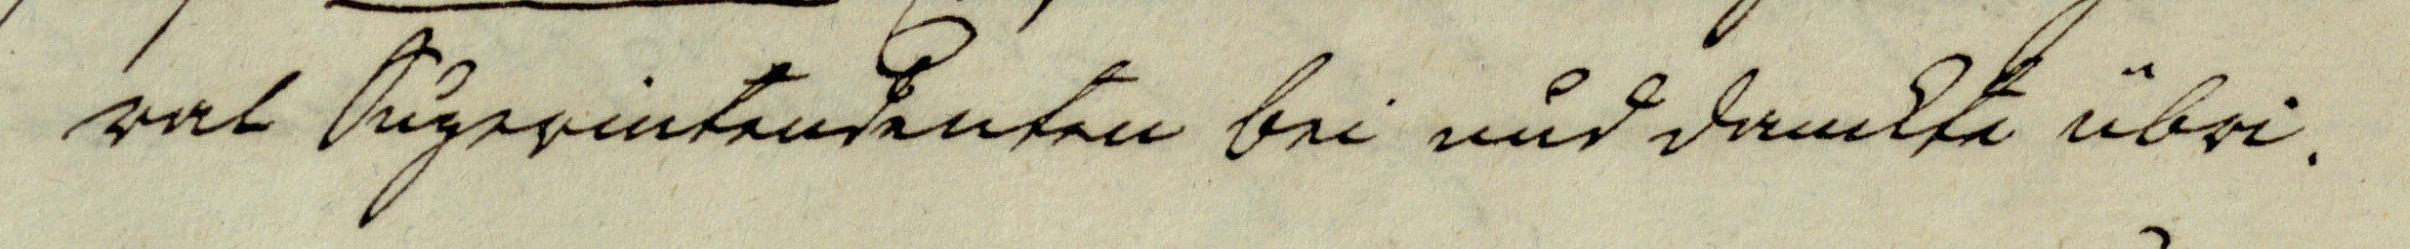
ral Superintendenten bei und danckte übri¬
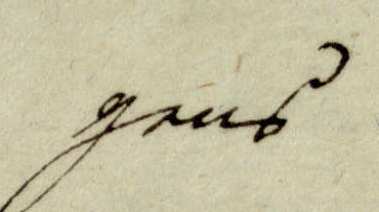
gens
